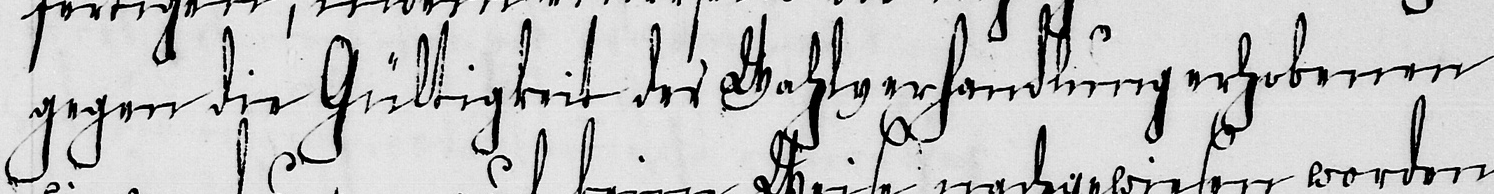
gegen die Gültigkeit der Wahlversammlung erhobenen
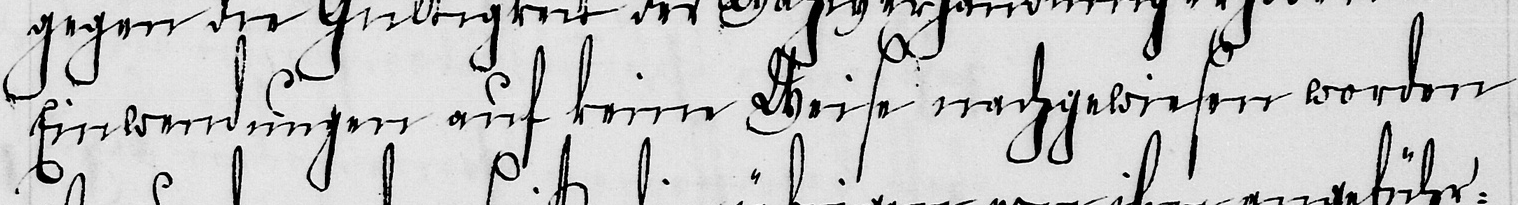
Einwendungen auf keine Weise nachgewiesen worden
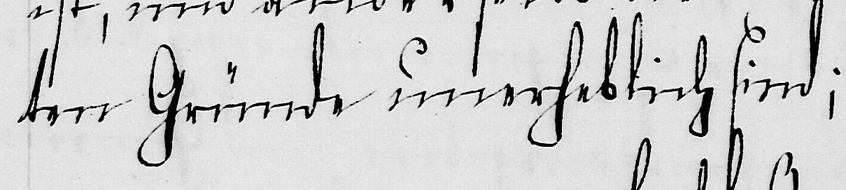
ten Gründe unerheblich sind;
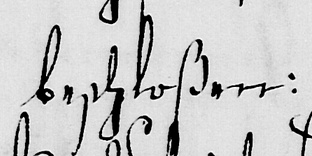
beschloßen:
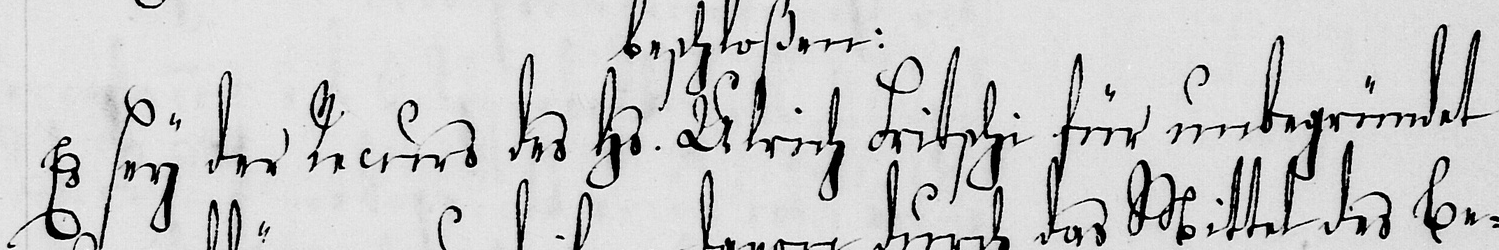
sey der Recurs des Hs. Ulrich Fritschi für unbegründet
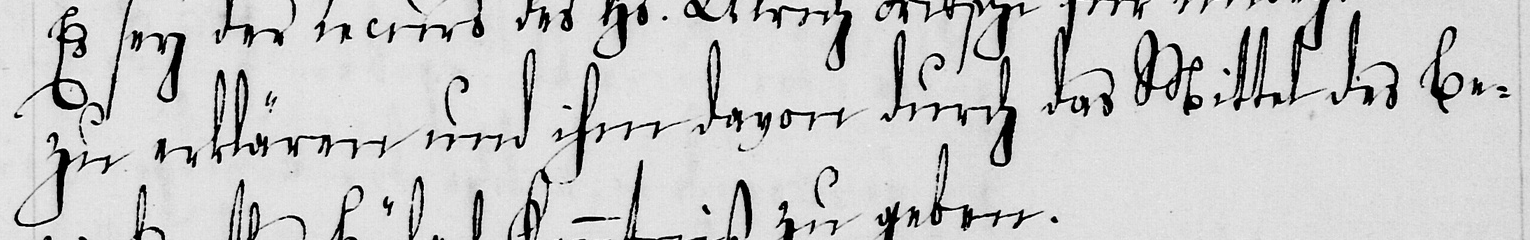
zu erklären und ihm davon durch das Mittel des Be¬
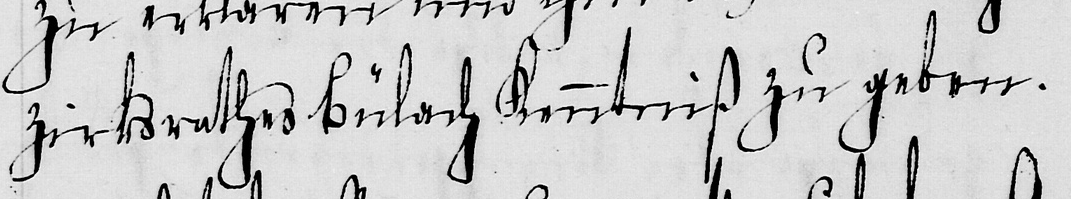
zirksrathes Bülach Kenntniß zu geben.
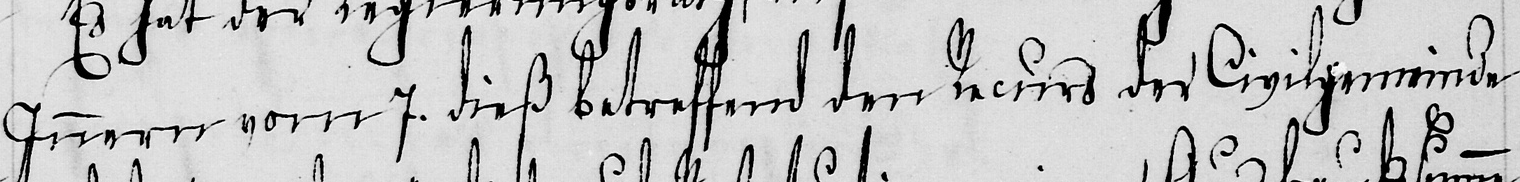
Innern vom 7. dieß betreffend den Recurs der Civilgemeinde
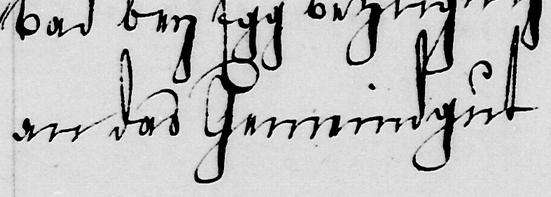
an das Gemeindgut
